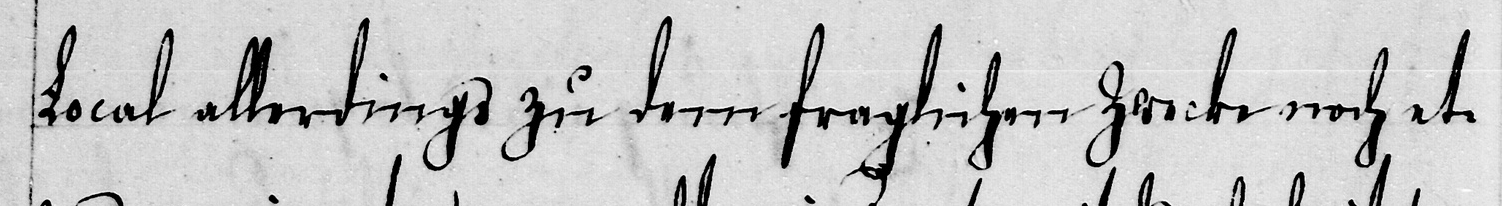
Local allerdings zu dem fraglichen Zwecke noch et¬
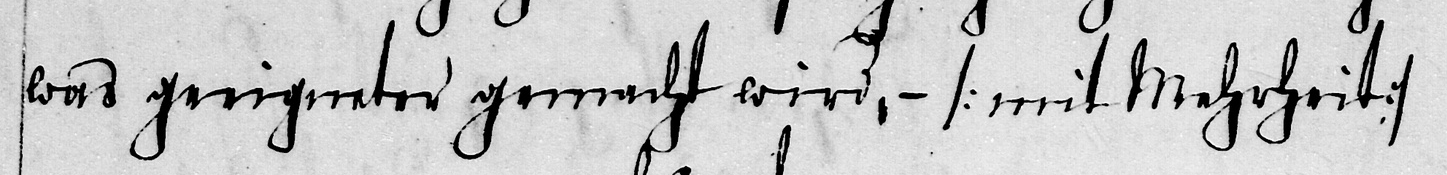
was geeigneter gemacht wird, – [mit Mehrheit]
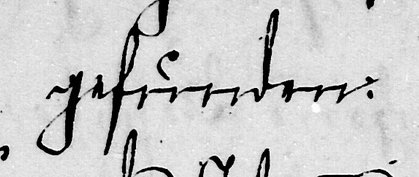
gefunden:
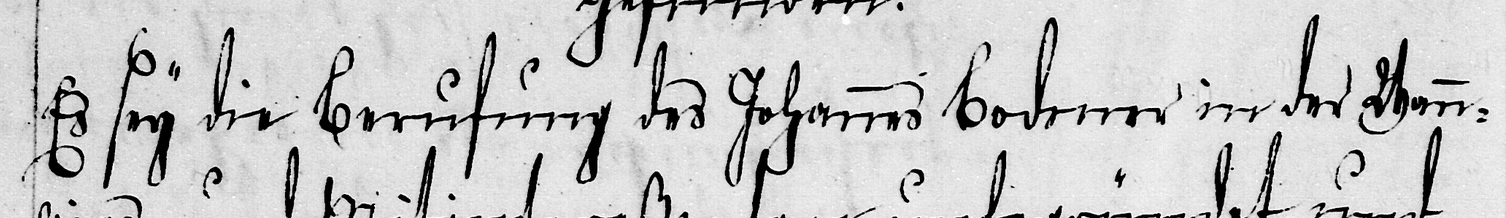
Es sey die Berufung des Johannes Bodmer in der Wann¬
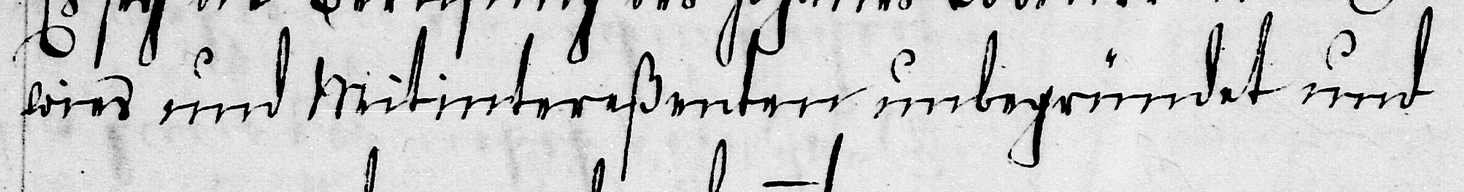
wies und Mitintereßenten unbegründet und
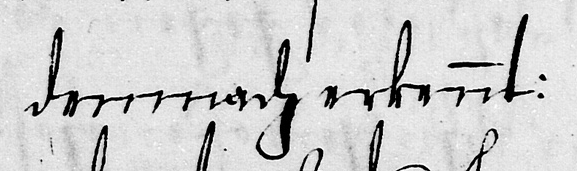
demnach erkennt:
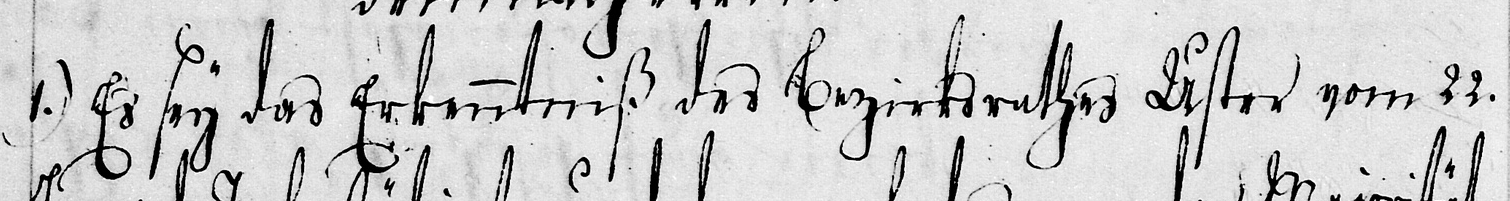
1.) Es sey das Erkenntniß des Bezirksrathes Uster vom 22.
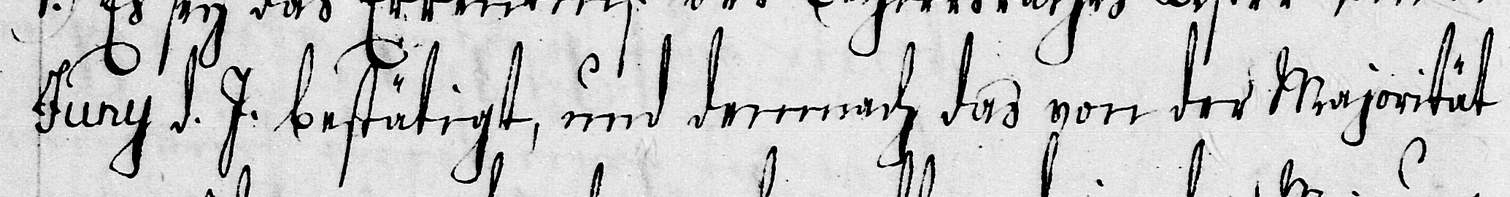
Juny d. J. bestätigt, und demnach das von der Majorität
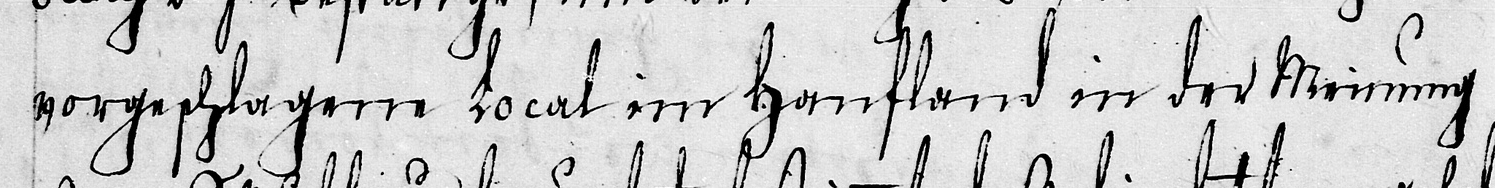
vorgeschlagene Local im Hanfland in der Meinung
